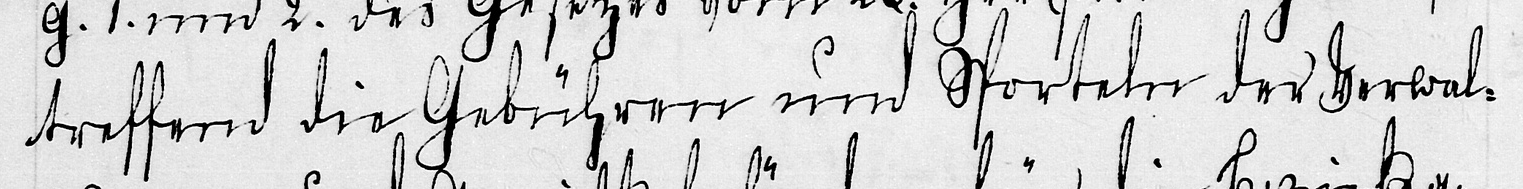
treffend die Gebühren und Sporteln der Verwal¬
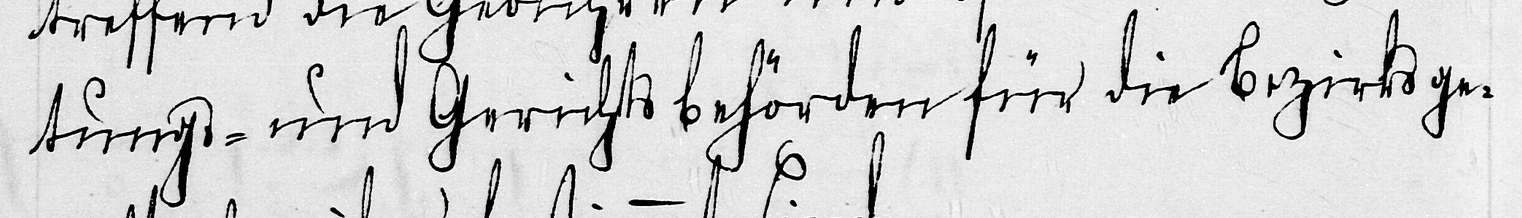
tungs- und Gerichtsbehörden für die Bezirksge¬
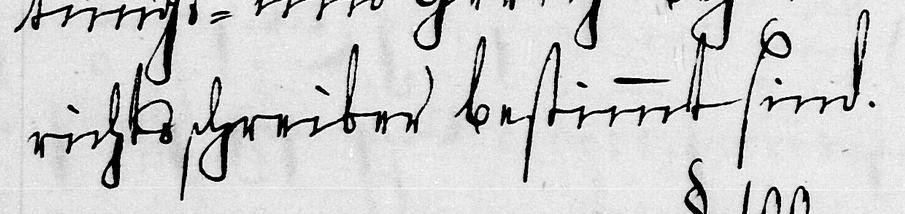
richtsschreiber bestimmt sind.
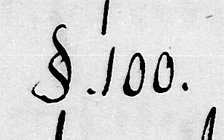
§. 100.
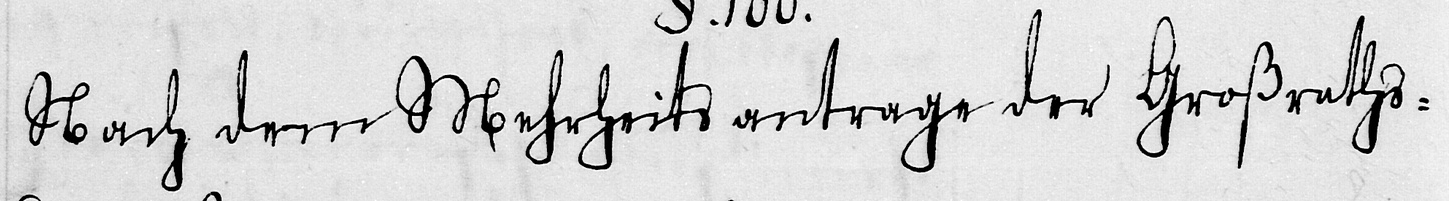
Nach dem Mehrheitsantrage der Großrath¬
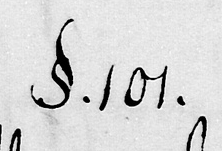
§. 101.
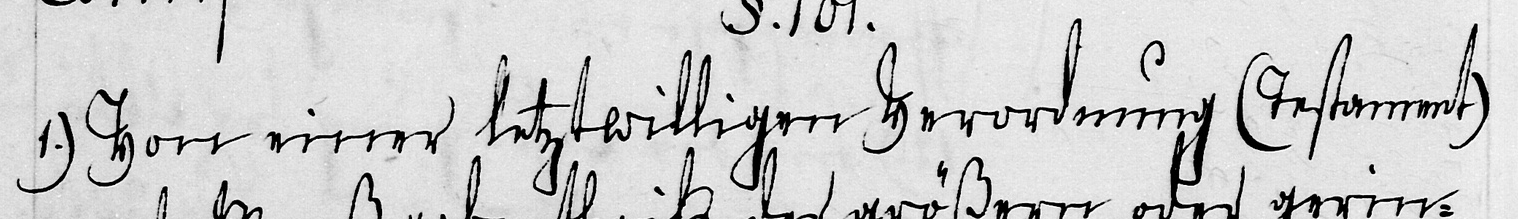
1.) Von einer letztwilligen Verordnung (Testament)
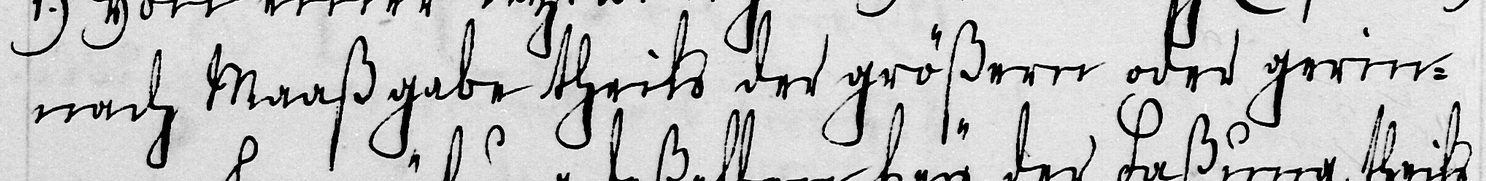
nach Maaßgabe theils der größern oder gerin¬
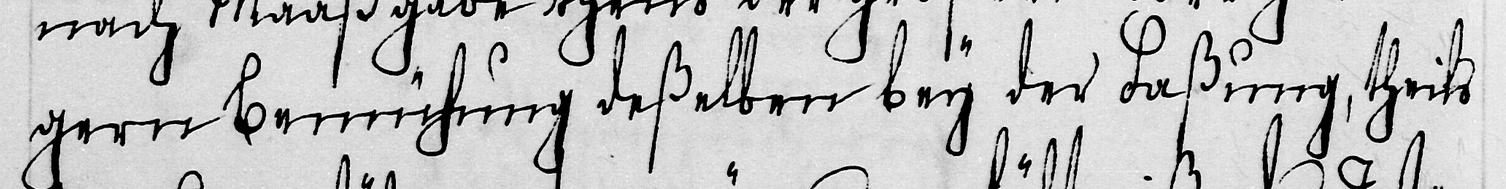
gern Bemühung deßelben bey der Faßung, theils
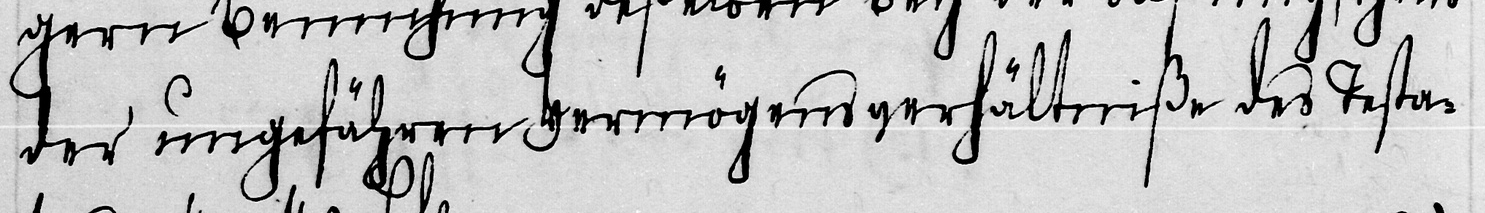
der ungefähren Vermögensverhältniße des Testa¬
